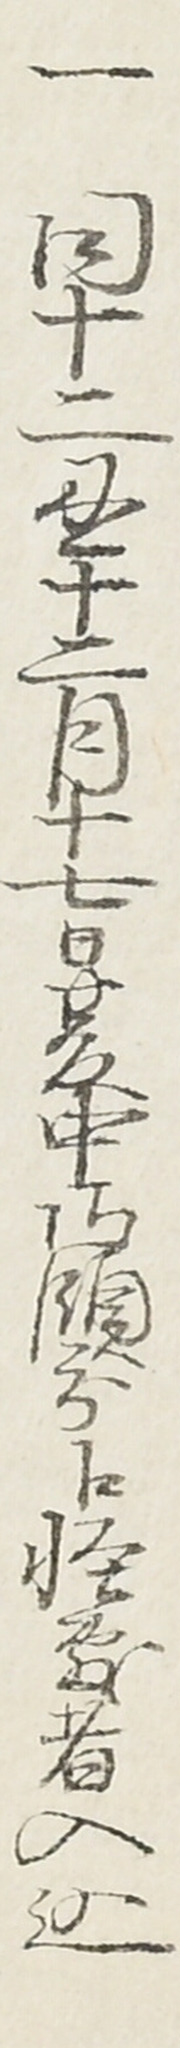一同十二丑十二月十七日夏中御領分江怪敷者入込
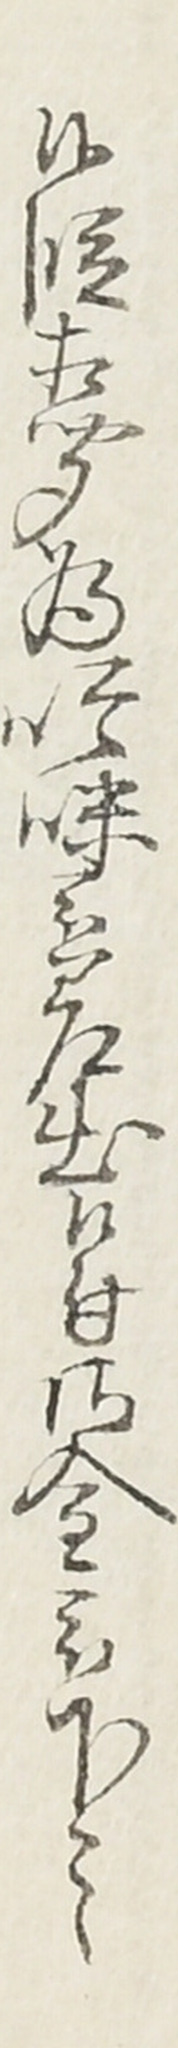候段相聞為吟味被差出候付御金被下之
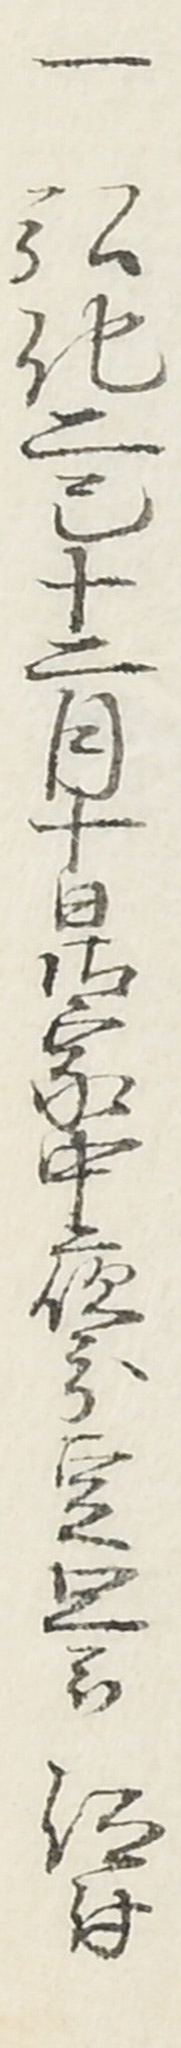一弘化二巳十二月十日御家中夜分定廻被仰付

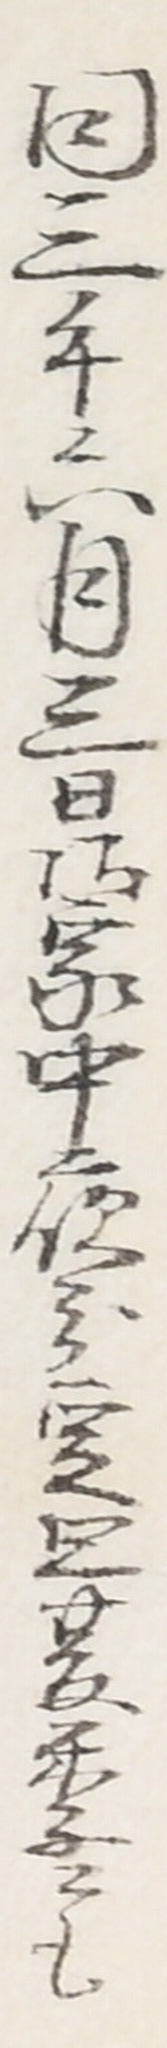一同三午六月三日御家中夜分定廻夏季ニも
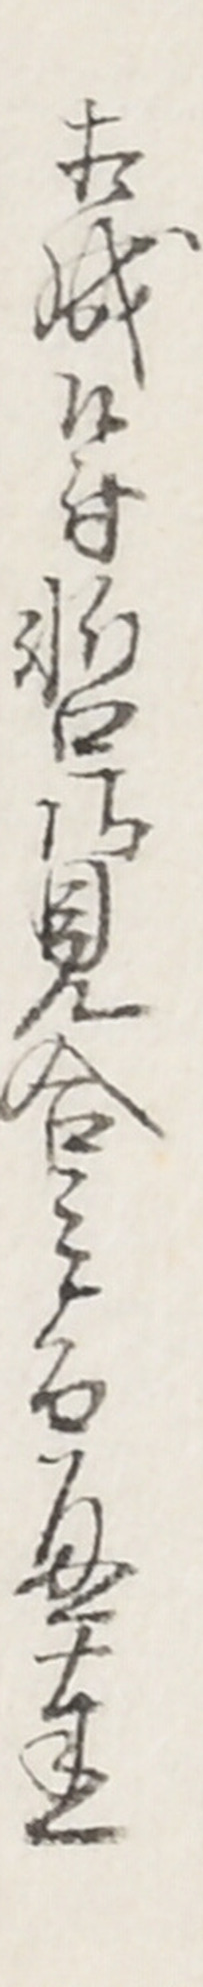相成候付暫御見合之旨通達

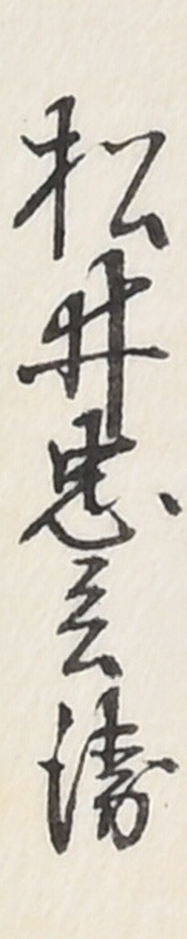松井忠兵衛
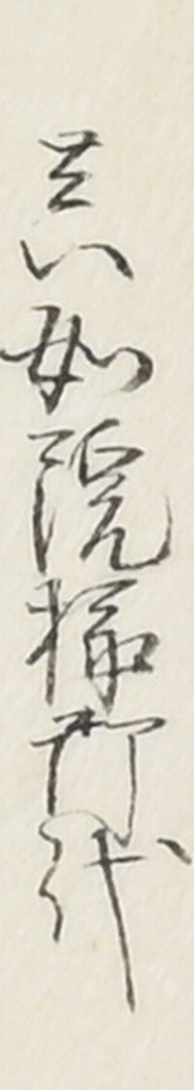真如院様御代
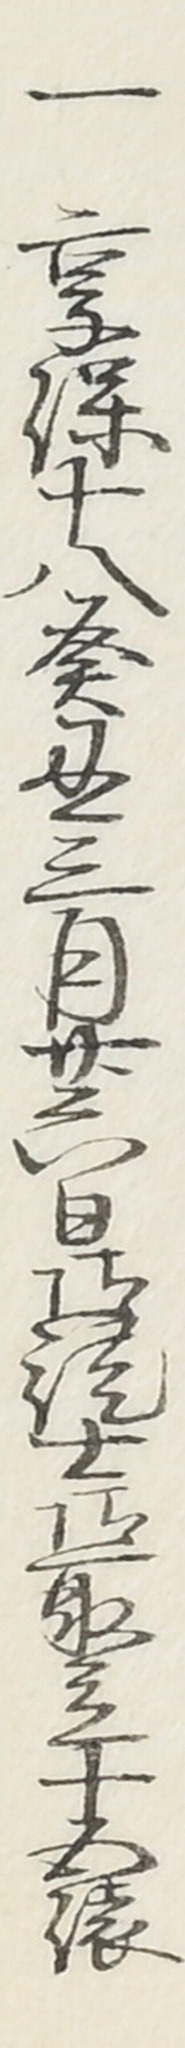一享保十八癸丑三月廿六日御徒士御取立十五俵
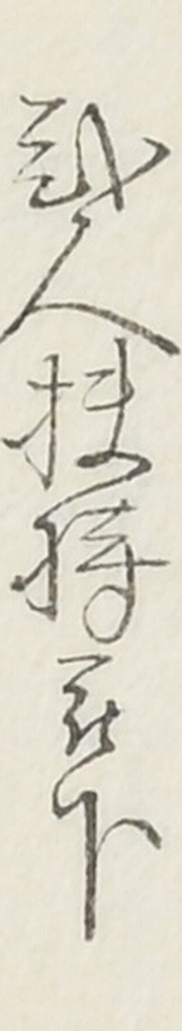弐人扶持被下
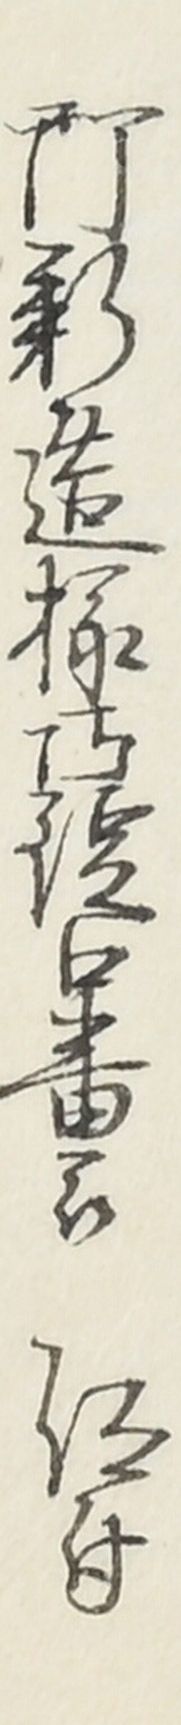御新造様御錠口番被仰付
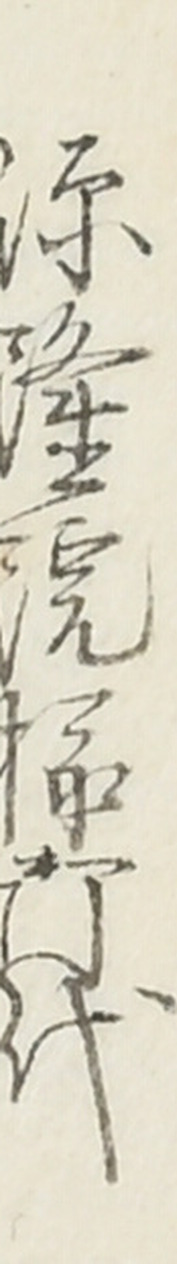源隆院様御代
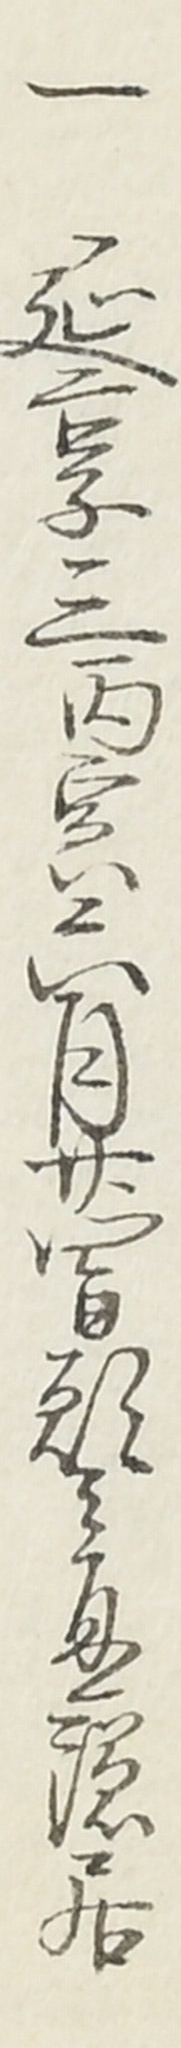一延享三丙寅六月廿四日願之通隠居
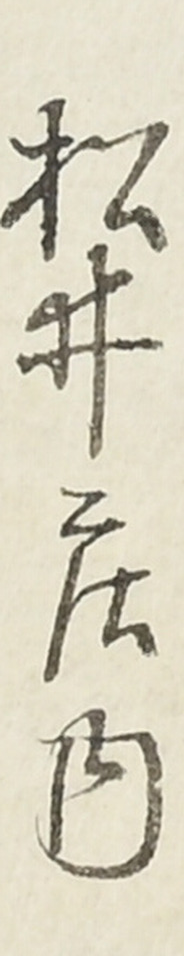松井庄内
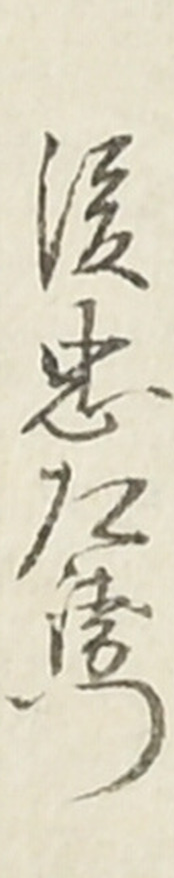後忠左衛門
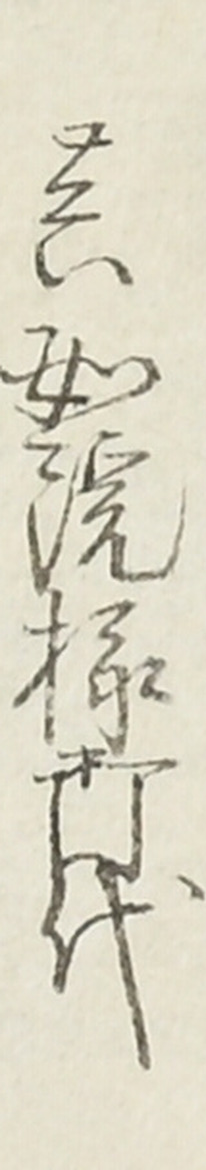真如院様御代
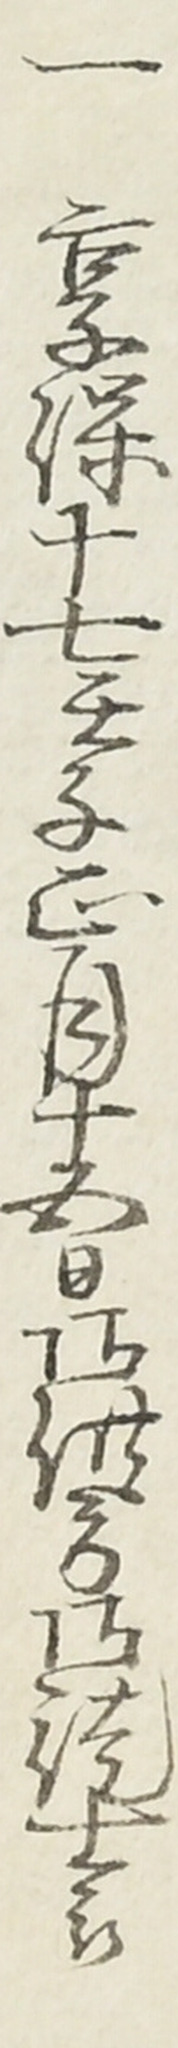一享保十七壬子正月十五日御供方御徒士被
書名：無足諸士勤仕録（四）
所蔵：伊那市立高遠町図書館・合同会社AMANE
